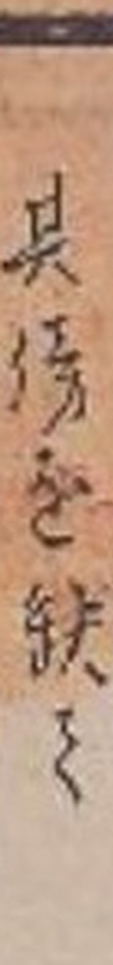其傍を缺て
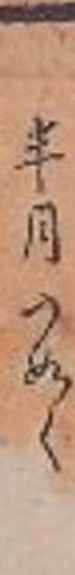半月の如く
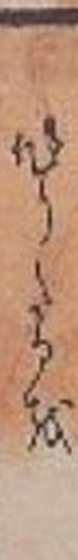作りたるを
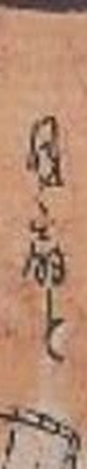月扇と
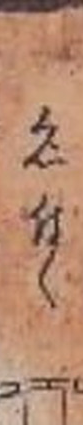名付く
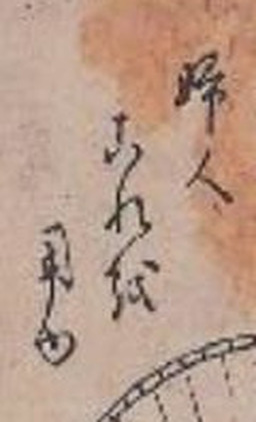これを

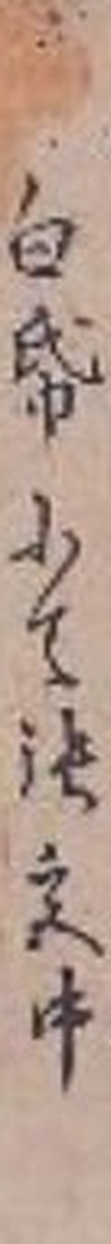白紙にて張宮中
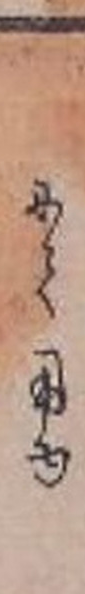にて用ゆ
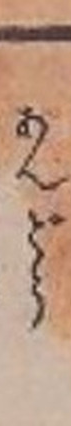あんどう
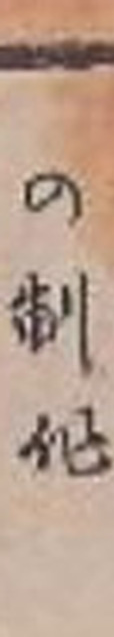の制作
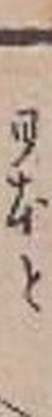日本と
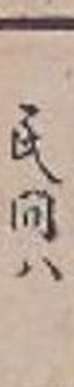民間は
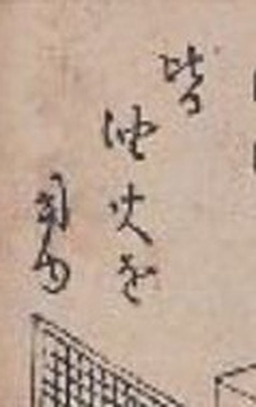油火を

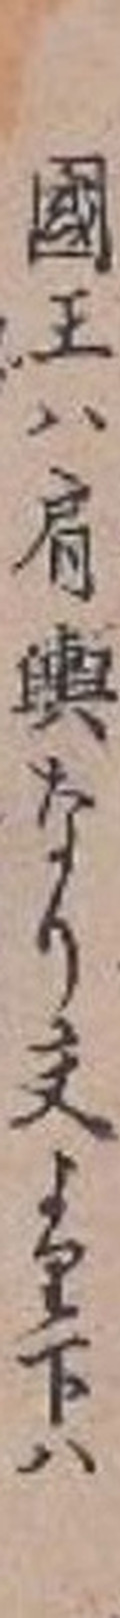国王は肩輿なり夫より下は
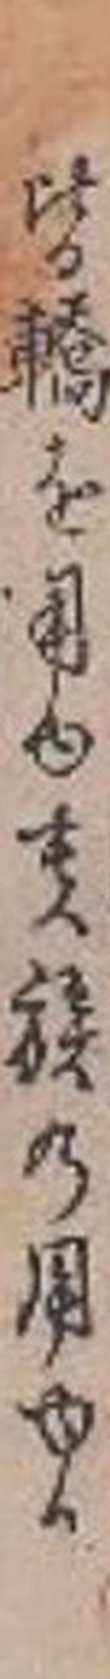皆轎を用ゆ貴族の用ゆる
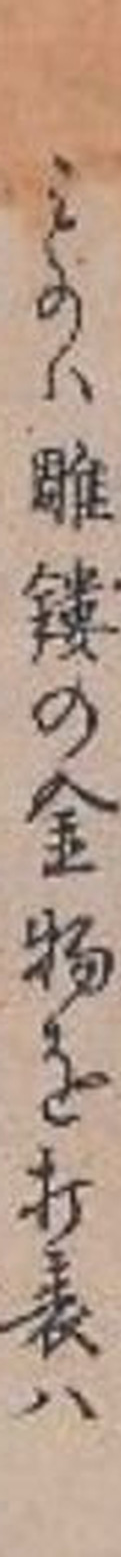ものは雕鏤の金物を打表は
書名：琉球談
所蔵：University of the Ryukyus Library
